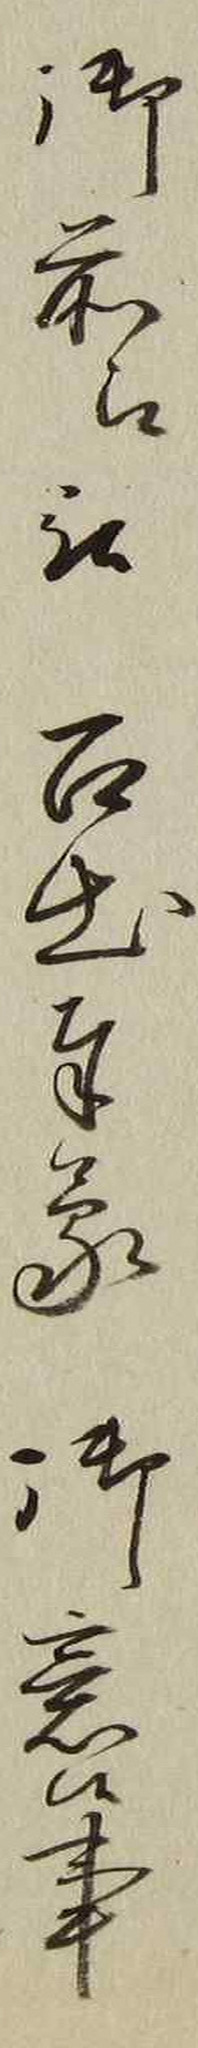御前え被召出奉蒙御意候事
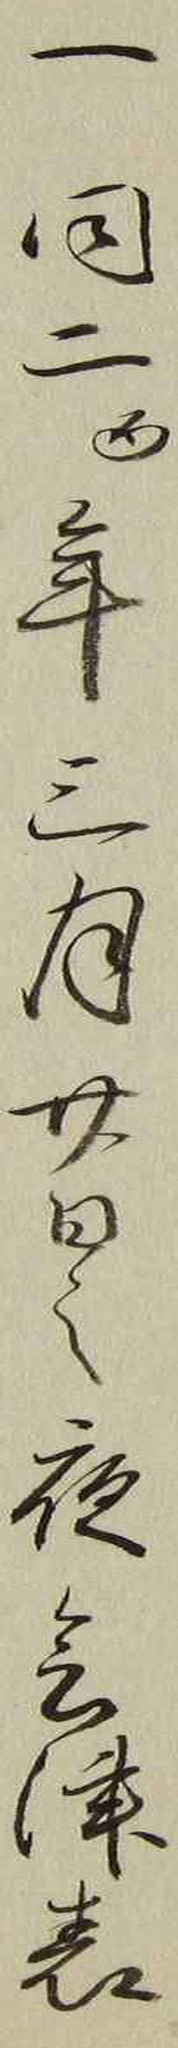一同二酉年三月廿日之夜会津表
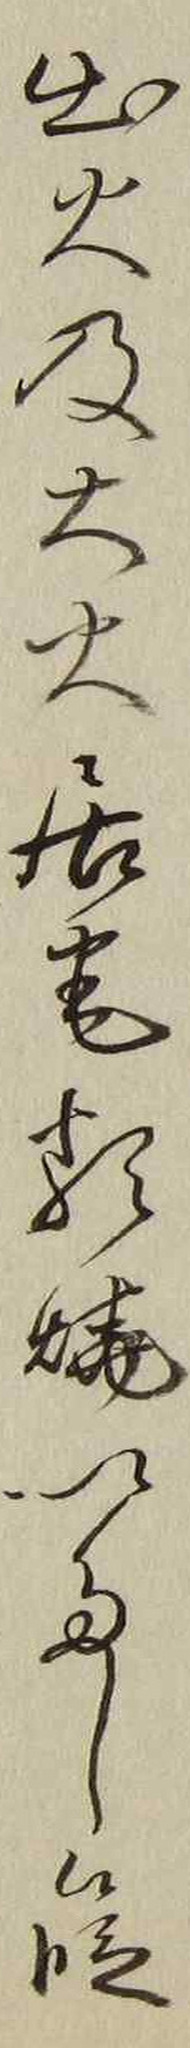出火及大火居宅類焼いたし候段
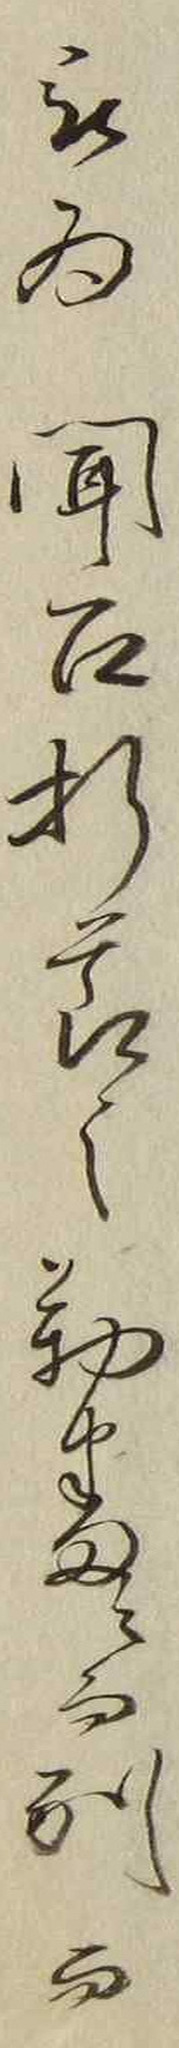被為聞召折節之勤番ニ而別而

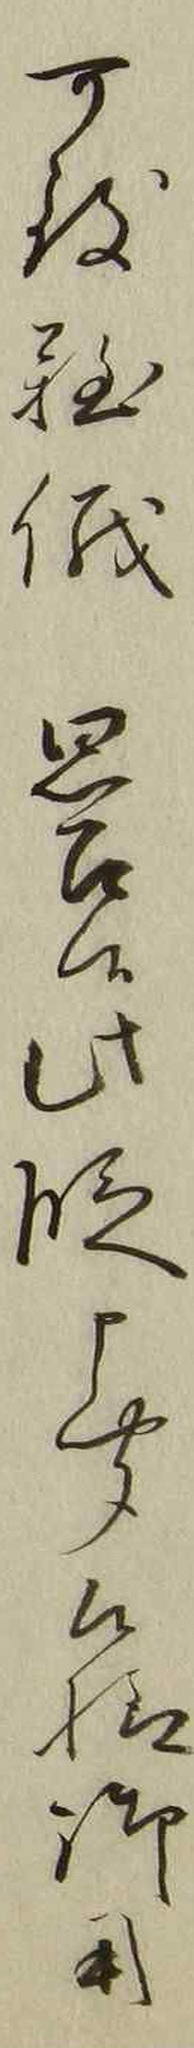可致難儀思召候此段申聞候様御用
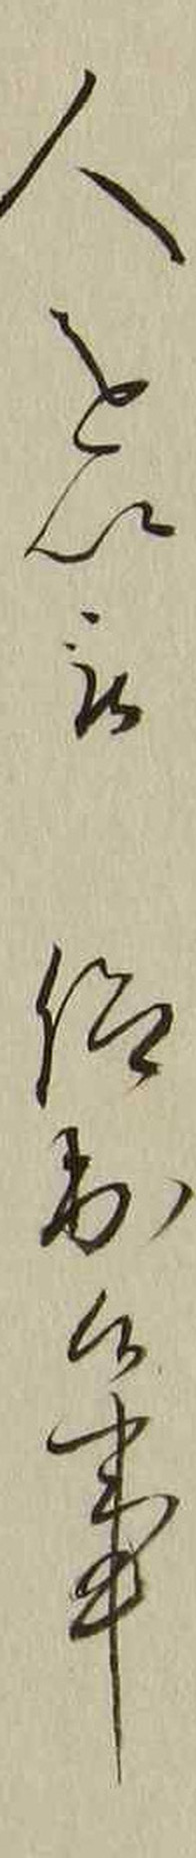人を以被仰出候事
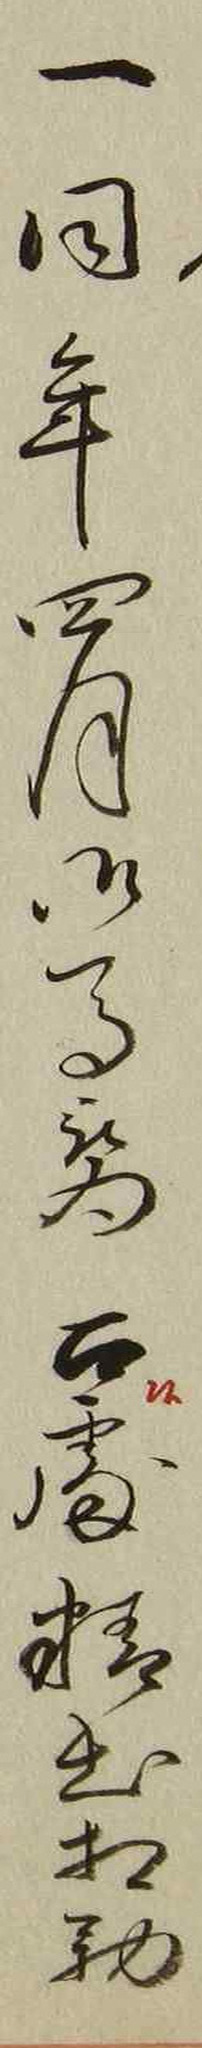一同年四月御馬被為召處精出相勤
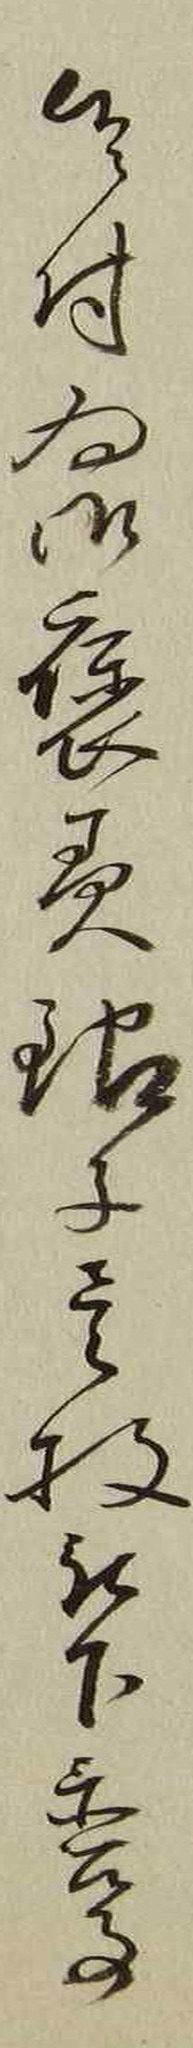候ニ付為御褒美銀子壱枚被下置候事
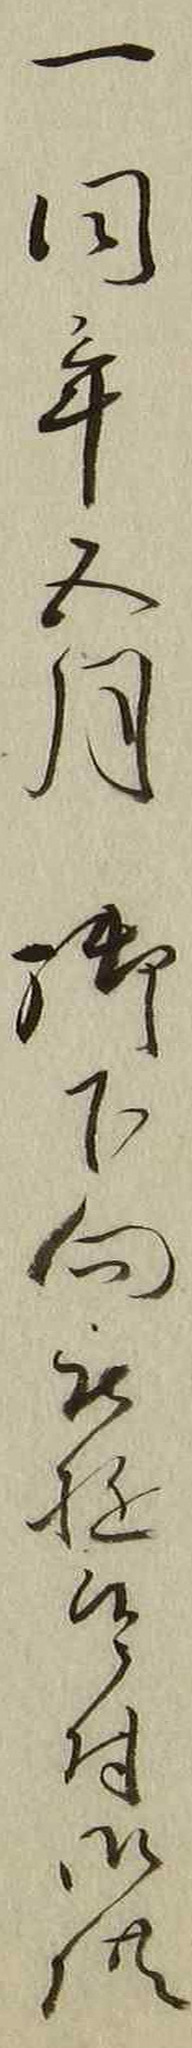一同年五月御下向被遊候ニ付御供
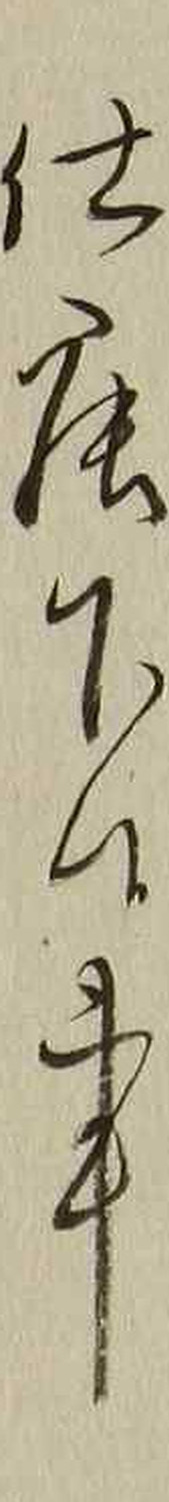仕罷下候事
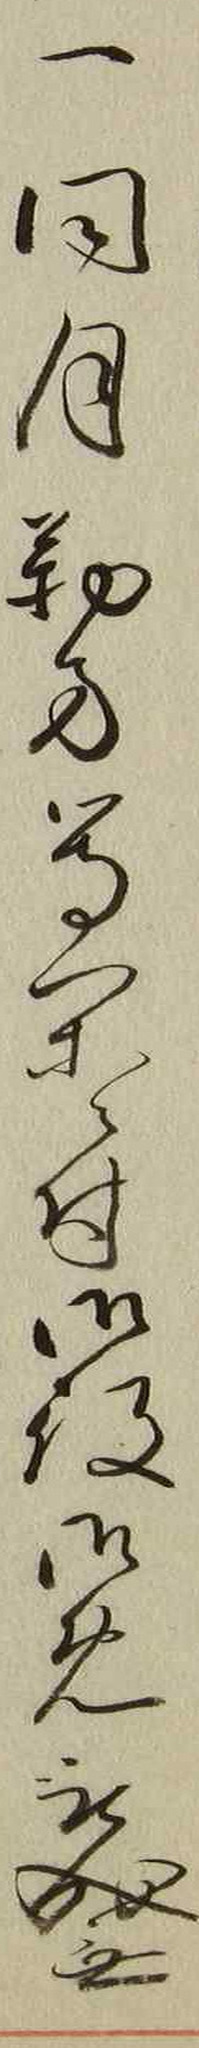一同月勤方等閑ニ付御役御免被成無
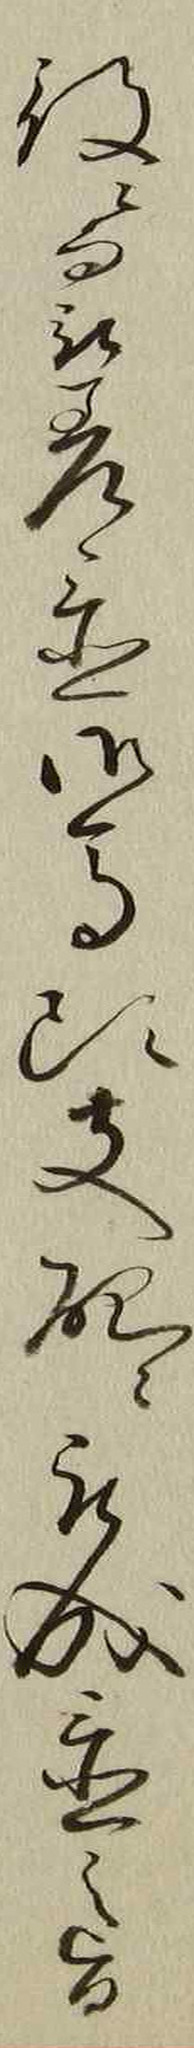役ニ而被差置御馬頭支配ニ被成置之旨
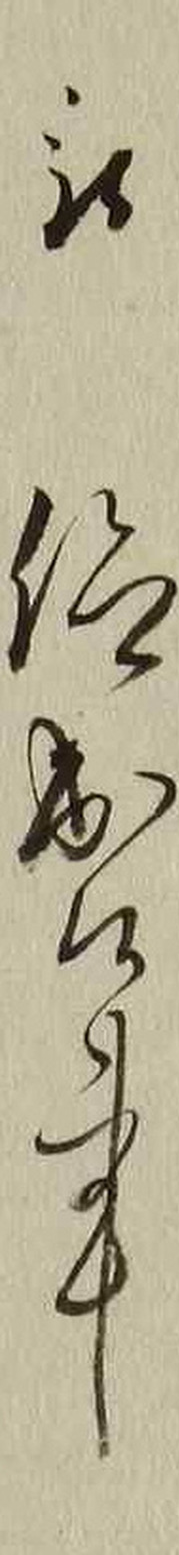被仰出候事
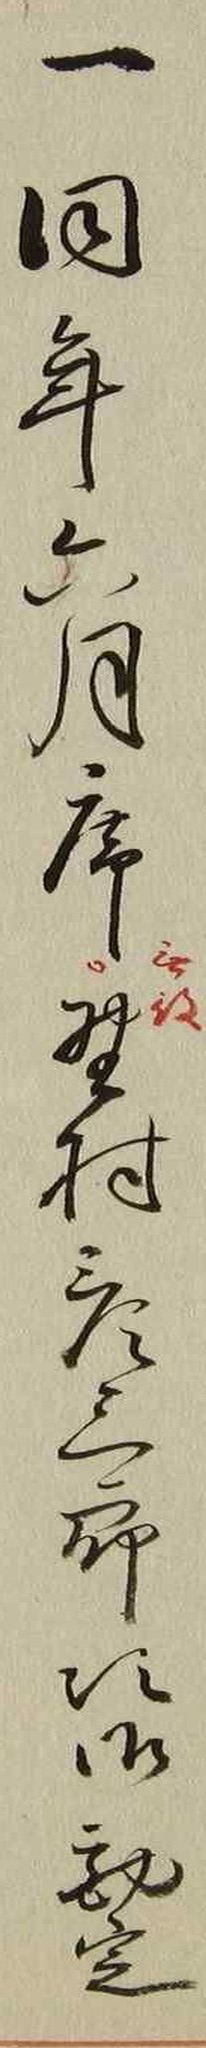一同年六月席◦野村彦三郎次御勘定
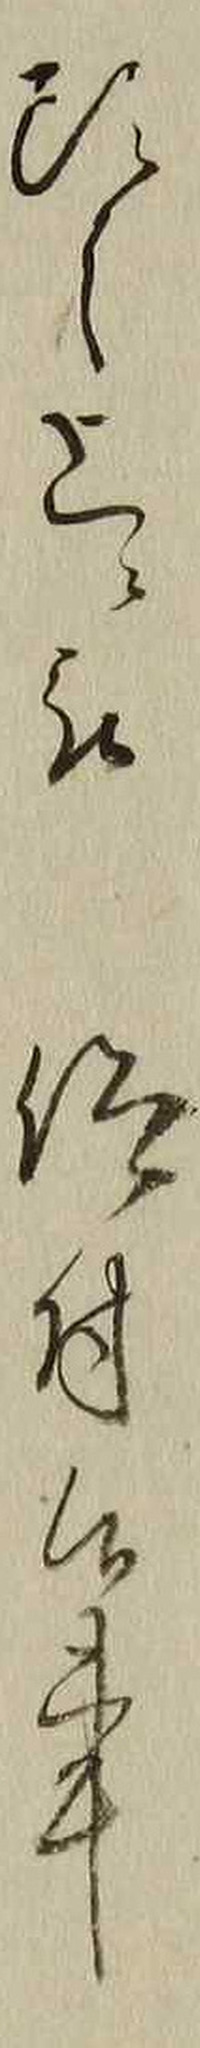頭之上ニ被仰付候事
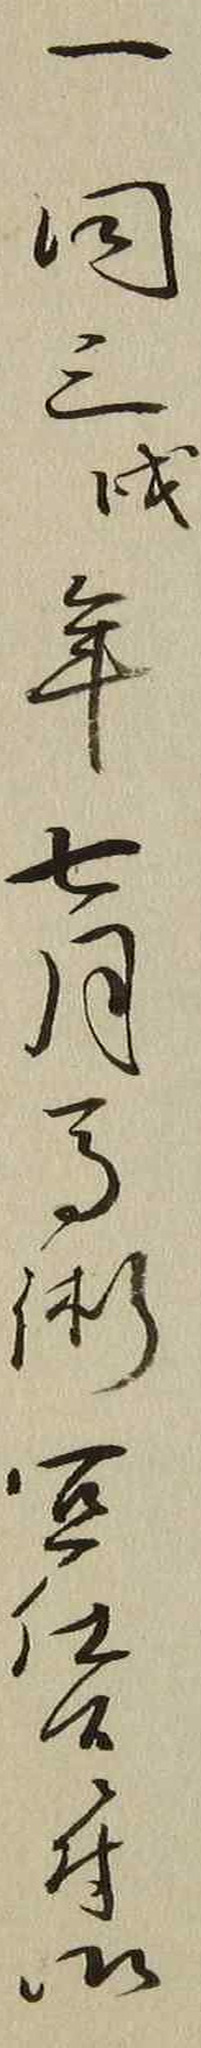一同三戌年七月馬術宜仕候ニ付御
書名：諸士系譜　巻之3　い之部3
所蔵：会津若松市立会津図書館
